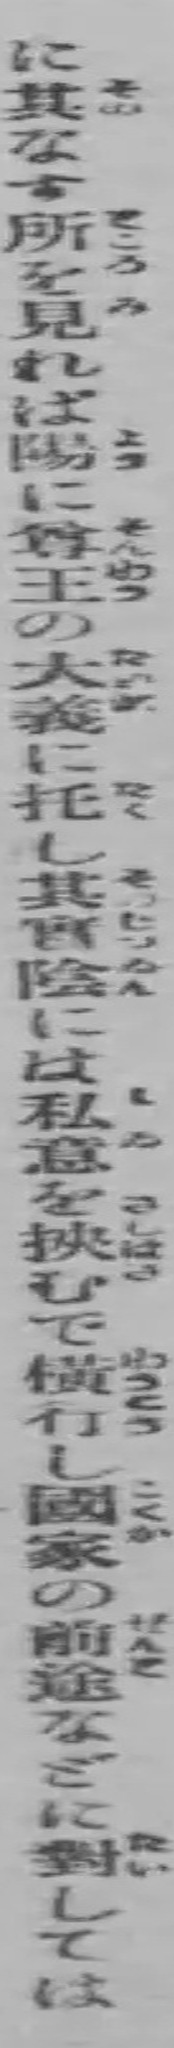に其なす所を見れば陽に尊王の大義に托し其実陰には私意を挟むで横行し国家の前途などに対しては
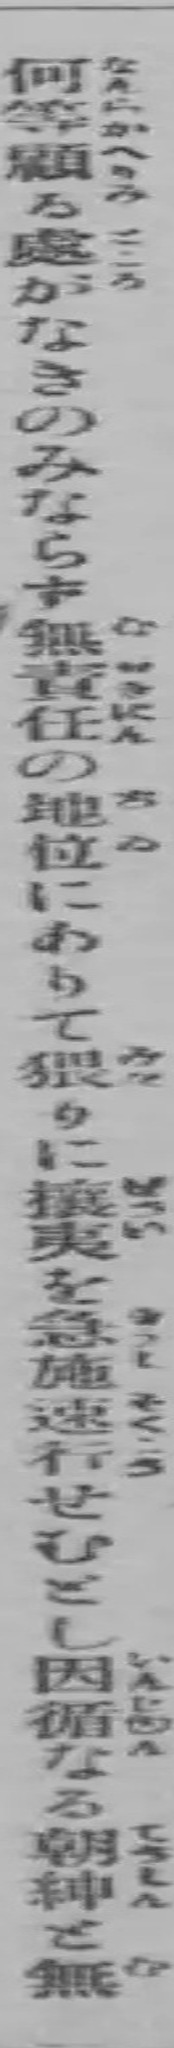何等顧る処がなきのみならず無責任の地位にありて猥りに攘夷を急施速行せむとし因循なる朝紳と無
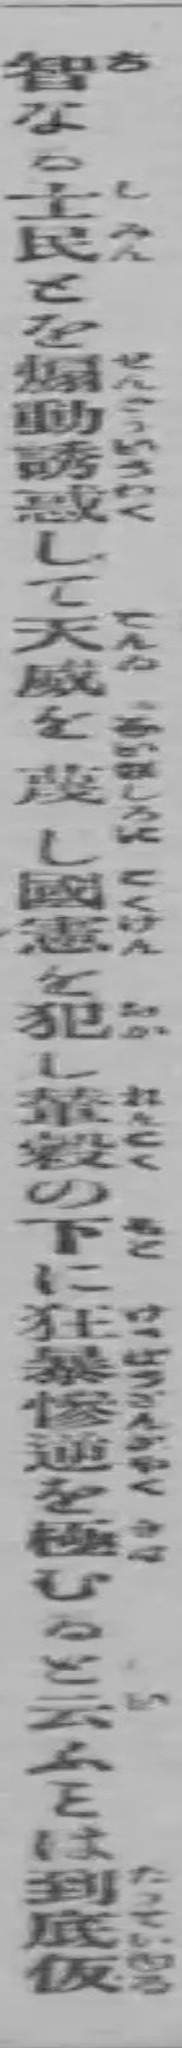智なる士民とを煽動誘惑して天威を蔑し国憲を犯し輦穀の下に狂暴惨逆を極むると云ふことは到底仮
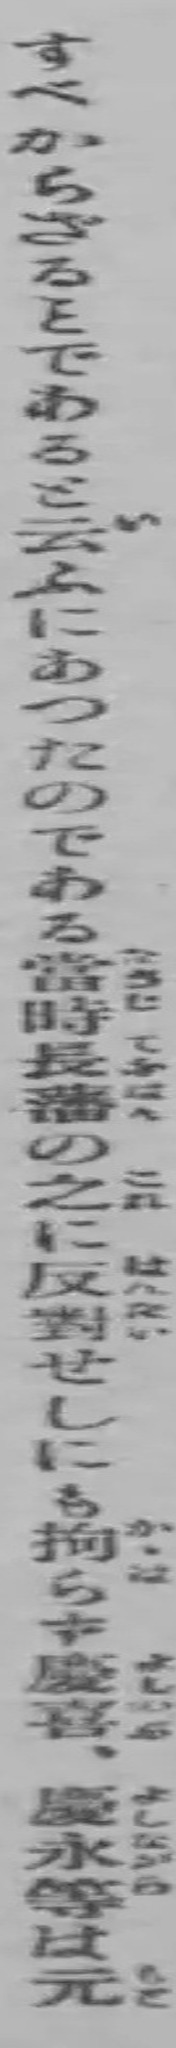すべからざることであると云ふにあつたのである当時長藩の之に反対せしにも拘らず慶喜、慶永等は元
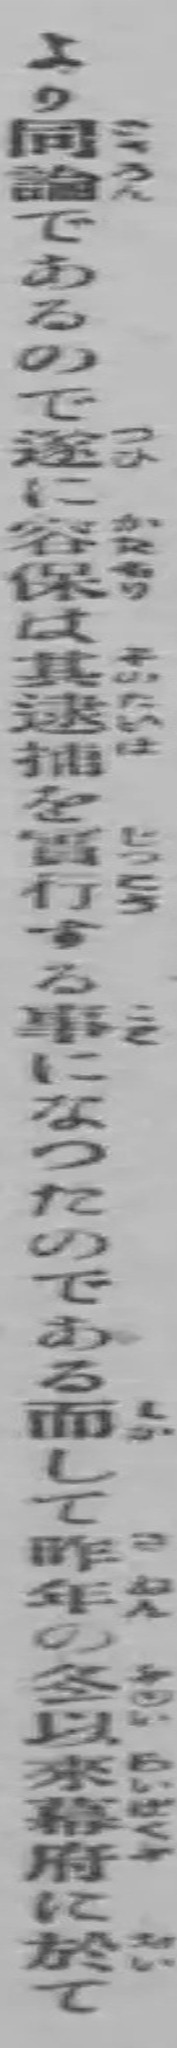より同論であるので遂に容保は其逮捕を実行する事になつたのである而して昨年の冬以来幕府に於て
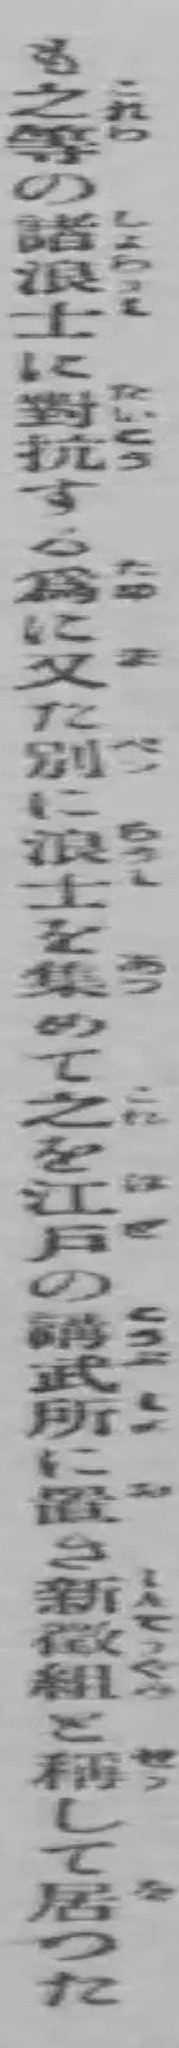新徴組並に壬生浪士も之等に対抗する為に又た別に浪士を集めて之を江戸の講武所に置き新徴組と称して居つた
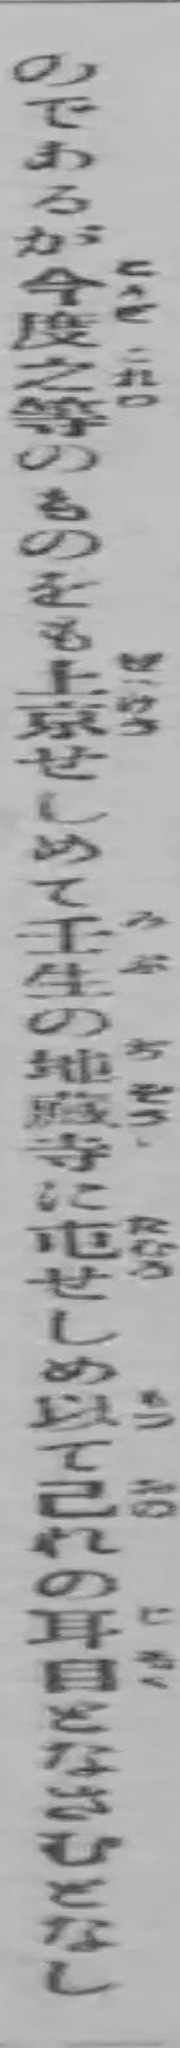のであるが今度之等のものをも上京せしめて壬生の地蔵寺に屯せしめ以て己れの耳目となさむとなし
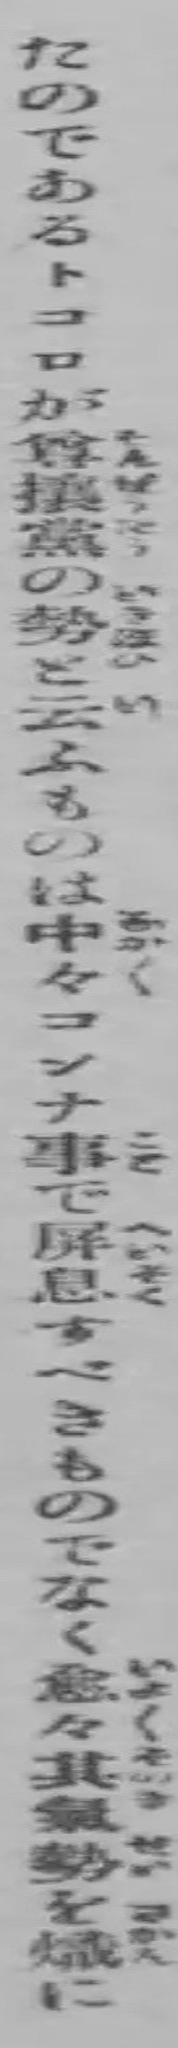たのであるトコロが尊攘党の勢と云ふものは中々コンナ事で屏息すべきものでなく愈々其気勢を熾に
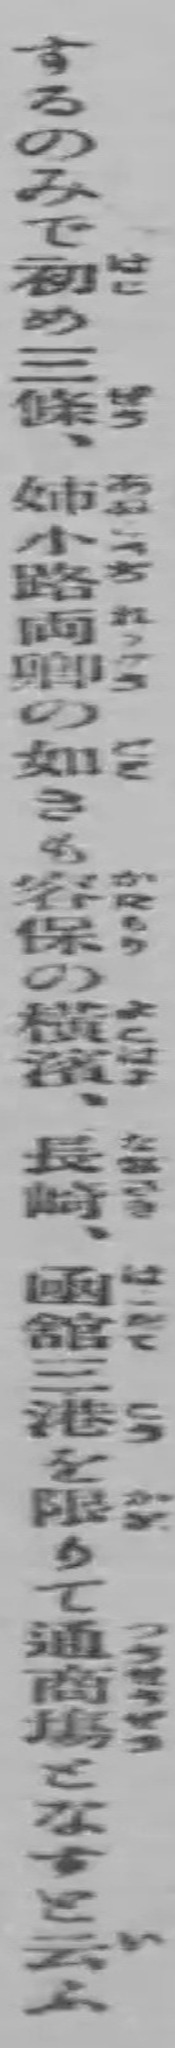するのみで初め三條、姉小路両卿の如きも容保の横浜、長崎、函館三港を限りて通商場となすと云ふ
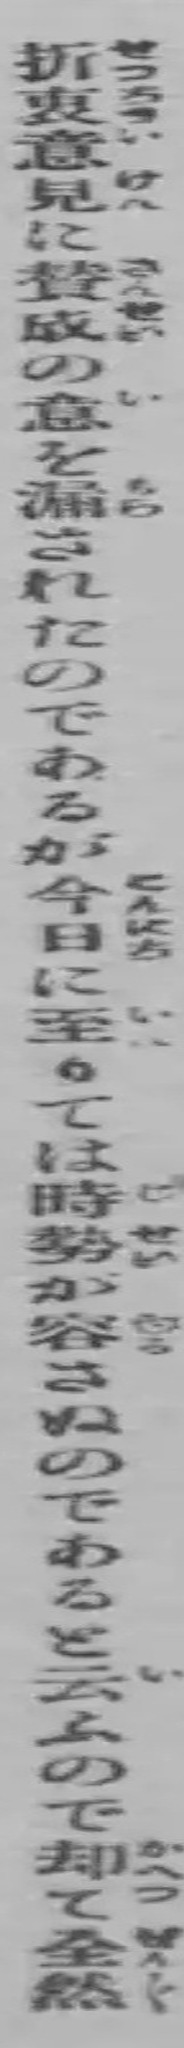折衷意見に賛成の意を漏されたのであるが今日に至りては時勢が容さぬのであると云ふので却て全然
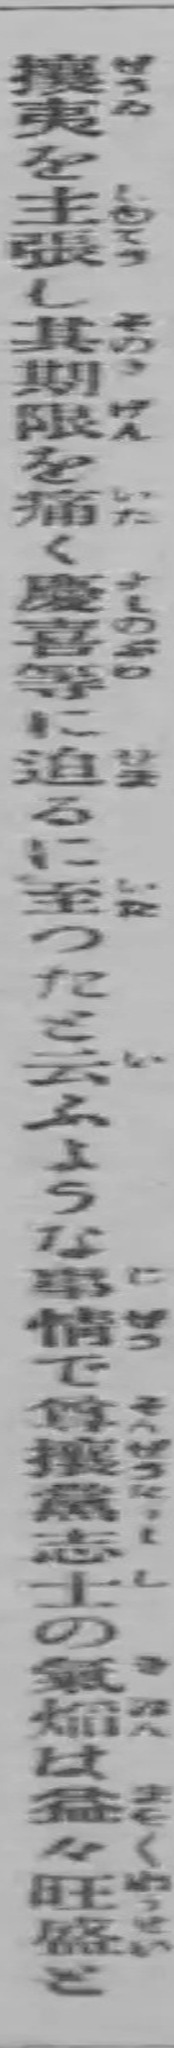攘夷を主張し其期限を痛く慶喜等に迫るに至つたと云ふような事情で尊攘党志士の気焔は益々旺盛と
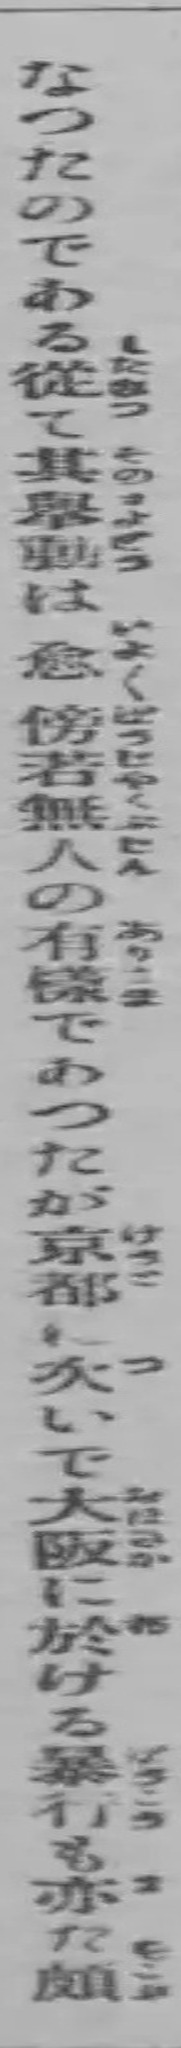なつたのである従て其挙動は愈傍若無人の有様であつたが京都に次いで大阪に於ける暴行も亦た頗
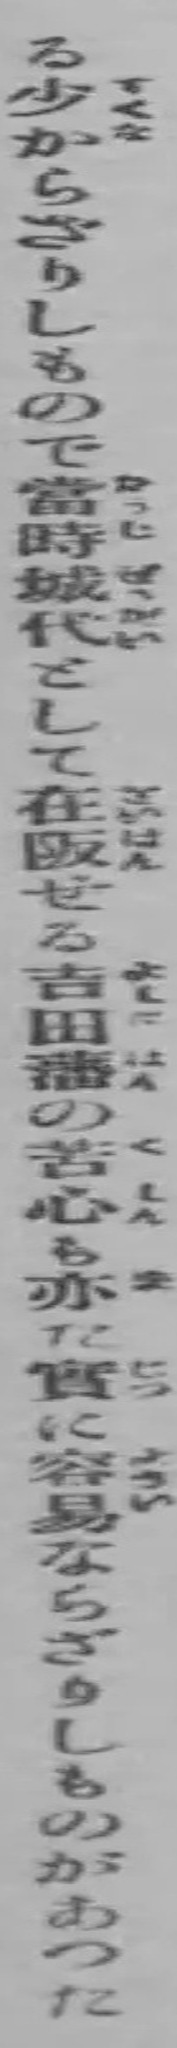る少からざりしもので当時城代として在阪せる吉田藩の苦心も亦た実に容易ならざりしものがあつた

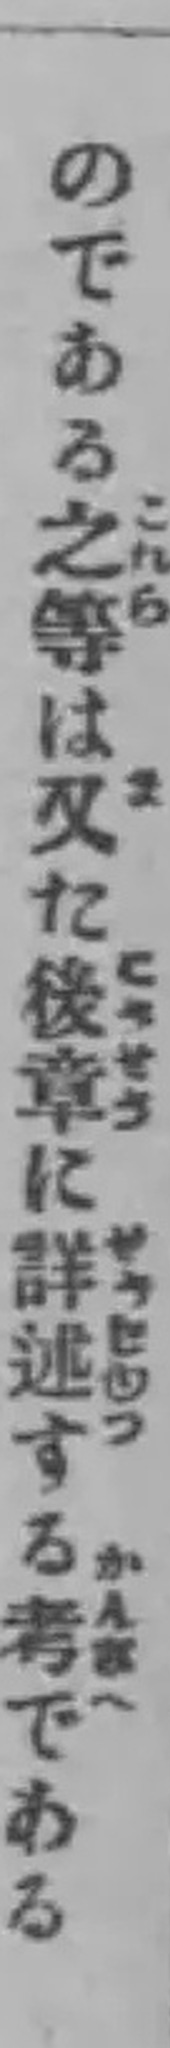のである之等は又た後章に詳述する考である
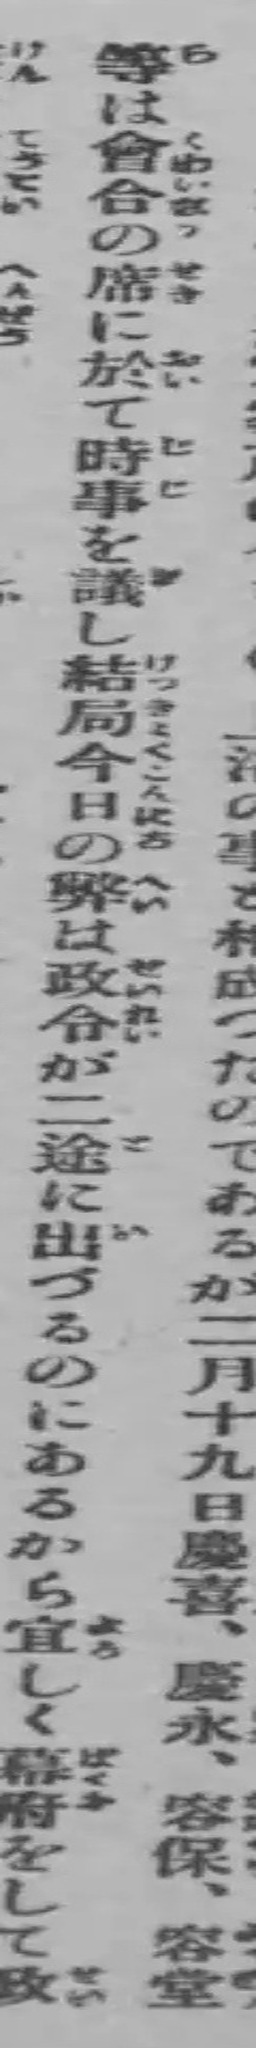等は会合の席に於て時事を議し結局今日の幣は政令が二途に出づるのにあるから宜しく幕府をして政
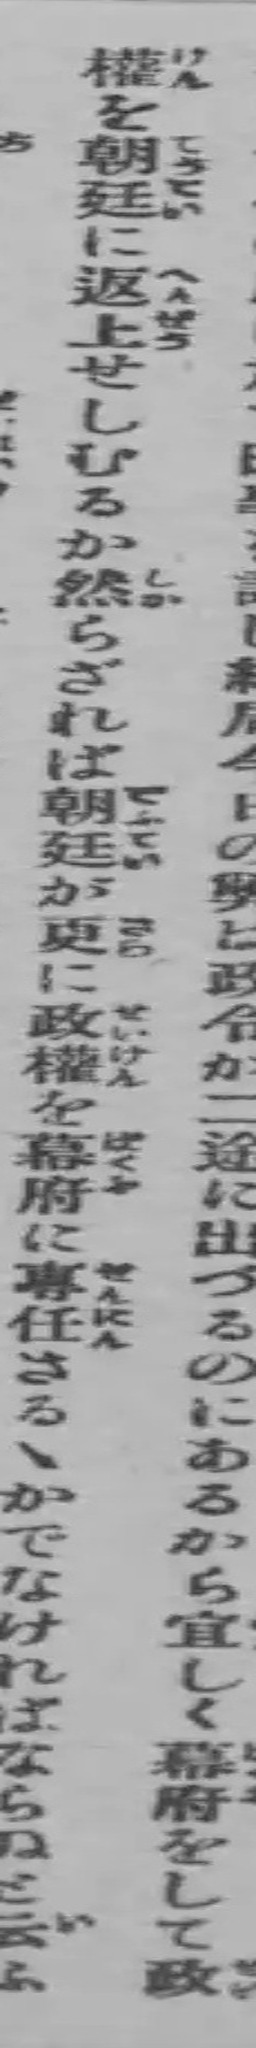権を朝廷に返上せしむるか然らざれば朝廷が更に政権を幕府に専任さるゝかでなければならぬと云ふ
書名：豊橋市史談
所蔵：国立国会図書館 National Diet Library, JAPAN
